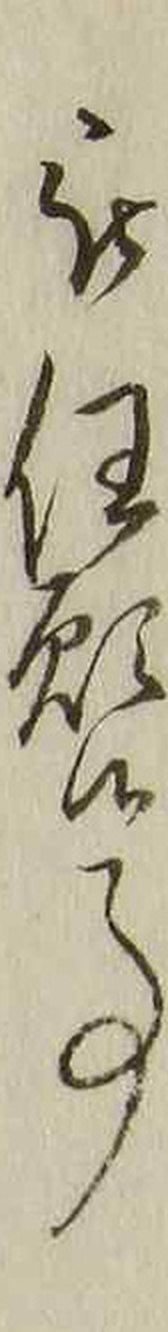被伺願候事
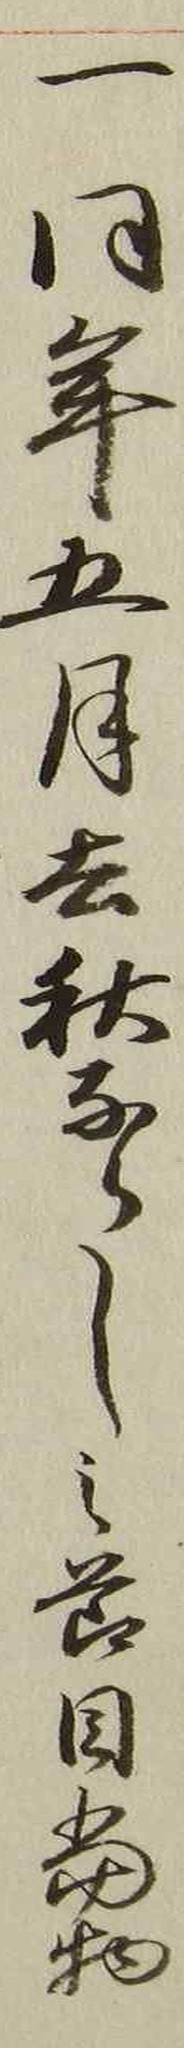一同年五月去秋ならし之節目当物
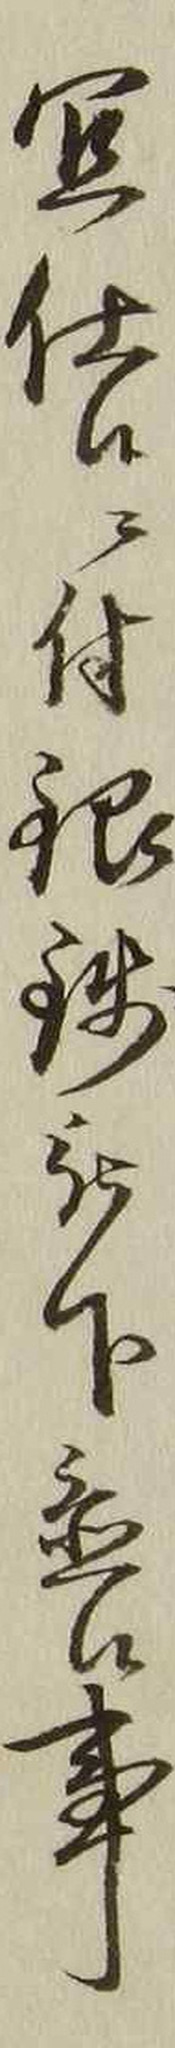宜仕候ニ付銀銭被下置候事
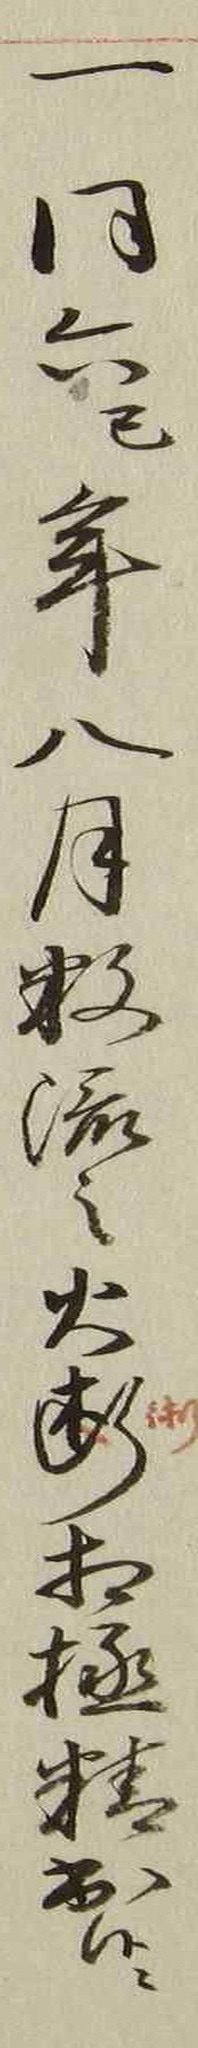一同六巳年八月数流之火術相極精出候ニ
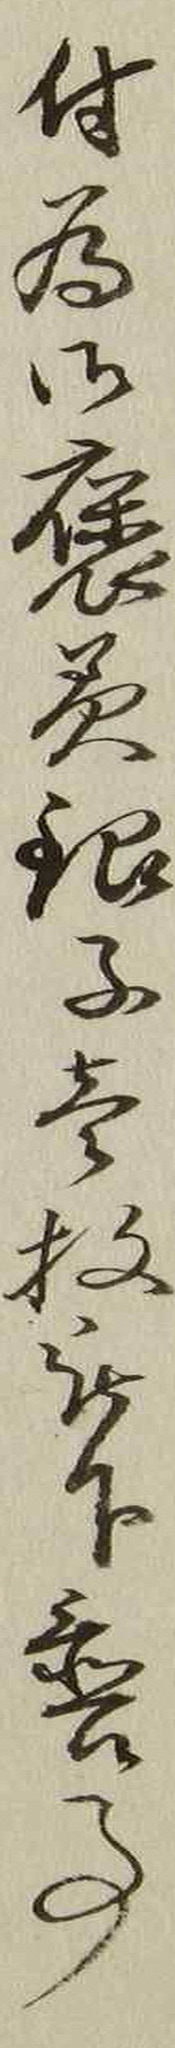付為御褒美銀子壱枚被下置候事
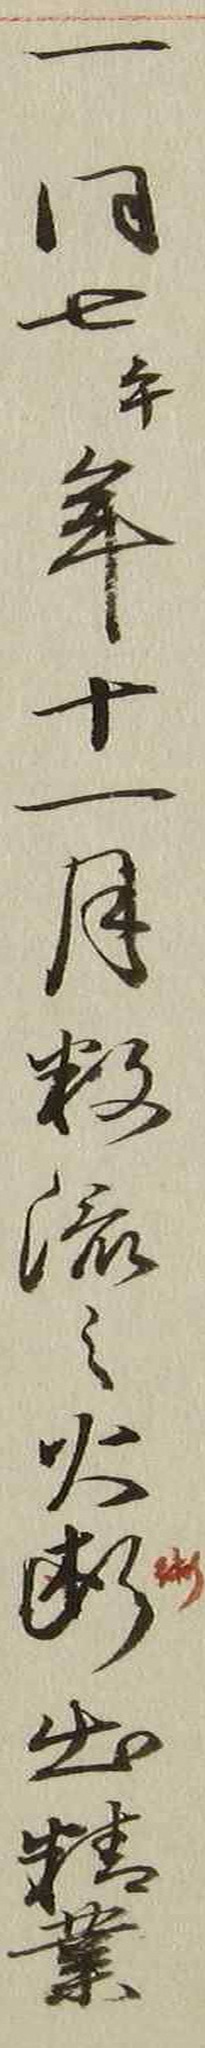一同七午年十一月数流之火術出精業
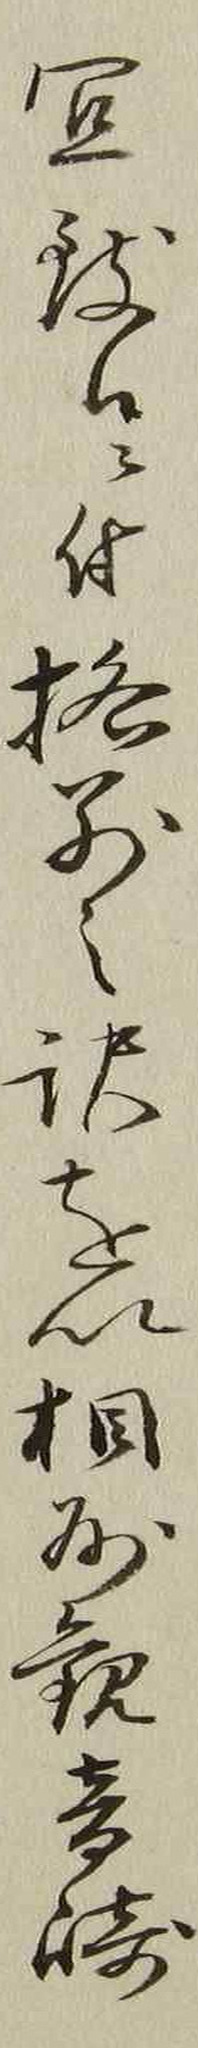宜致候ニ付格別之訳を以相州観音崎
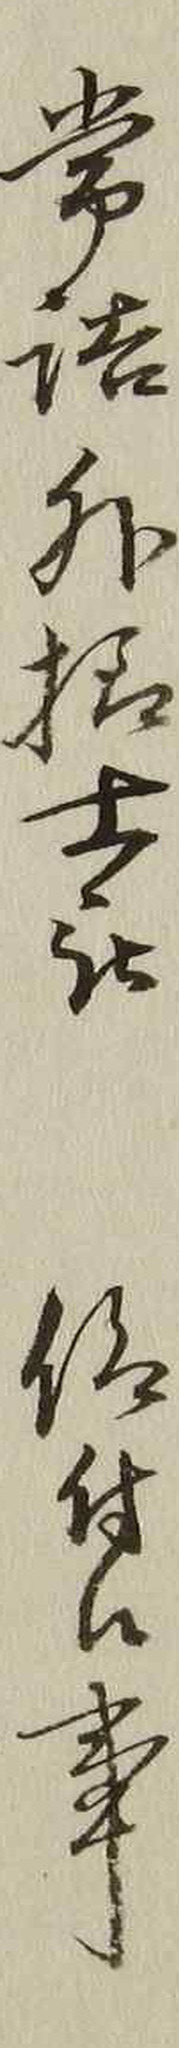常詰外様士被仰付候事
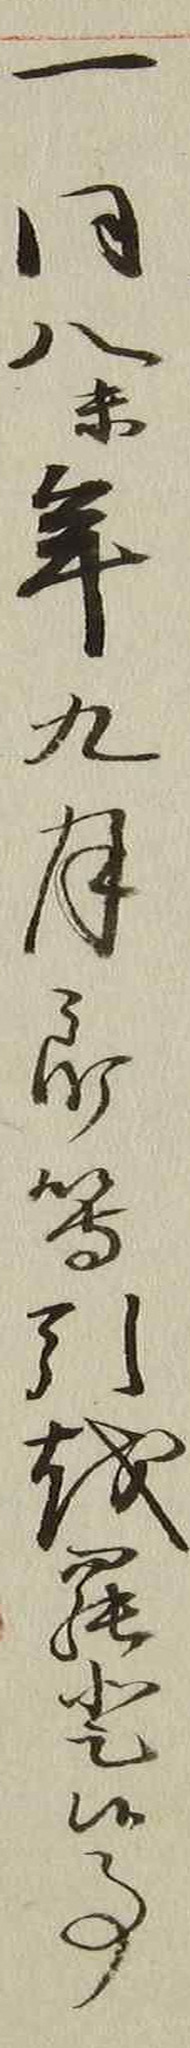一同八未年九月郎等引越罷登候事
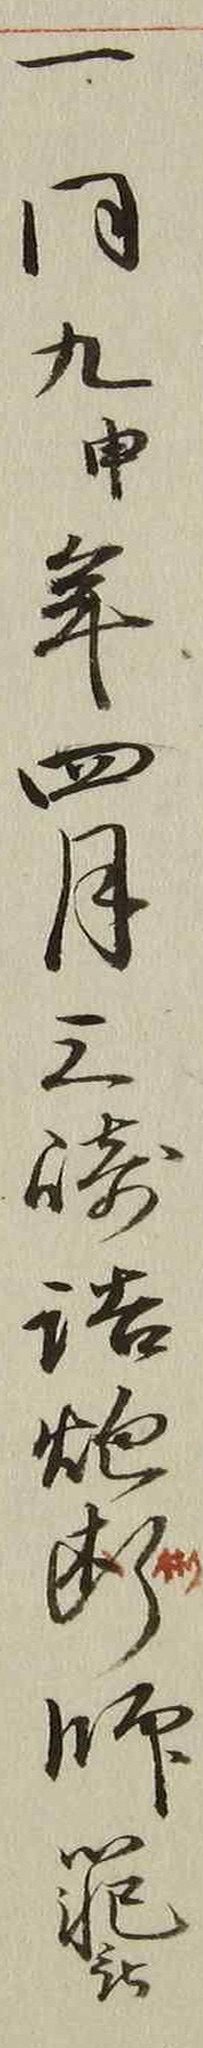一同九申年四月三崎詰炮術師範被
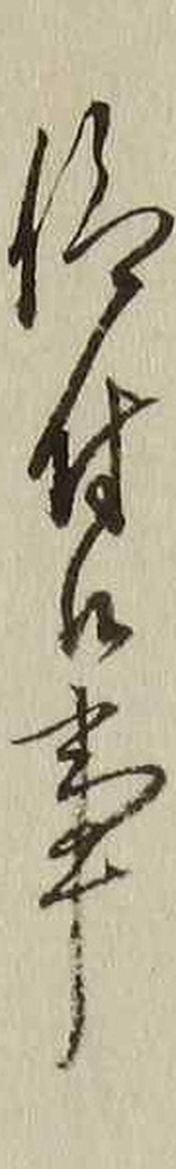仰付候事
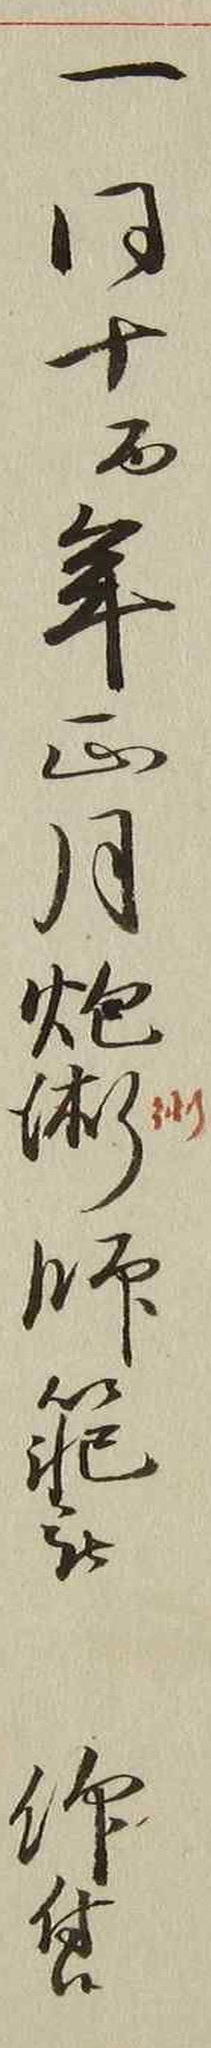一同十酉年正月炮術師範被仰付候
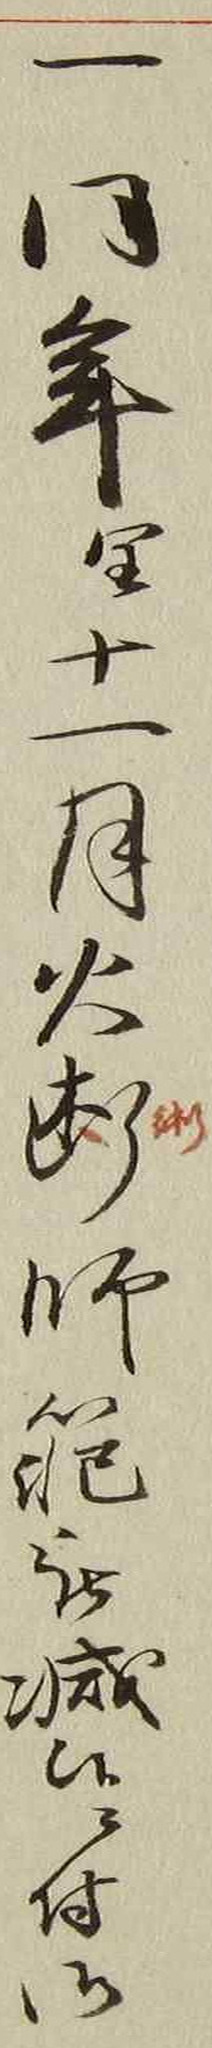一同年閏十一月火術師範被減候ニ付御
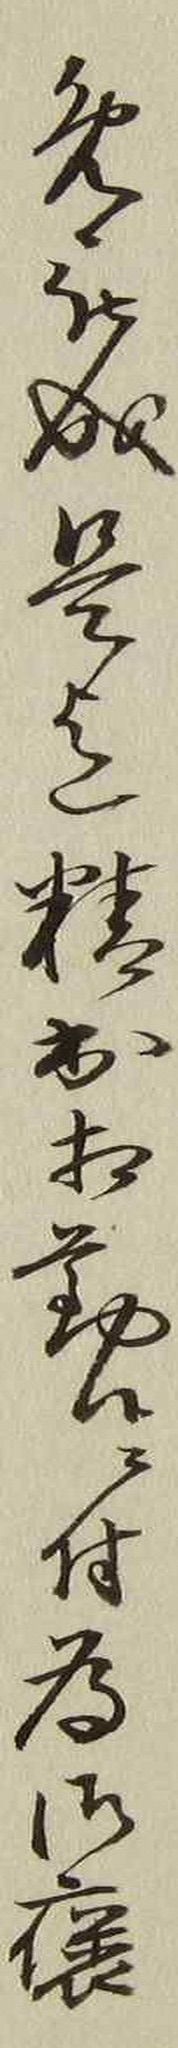免被成是迄精出相勤候ニ付為御褒
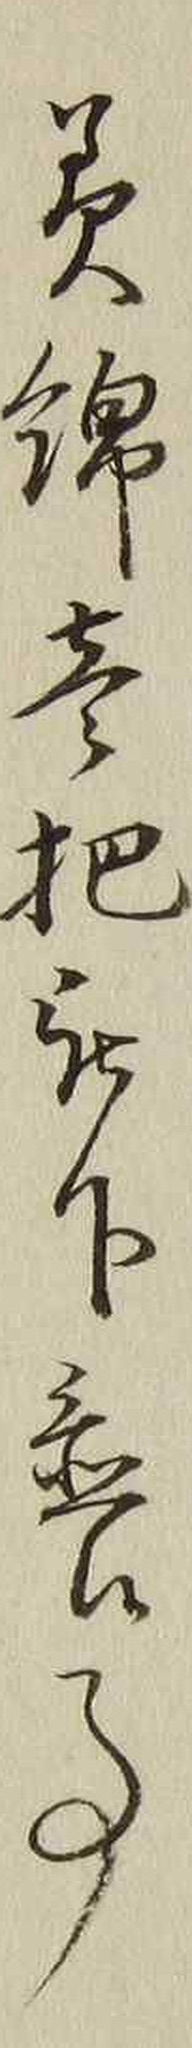美綿壱把被下置候事
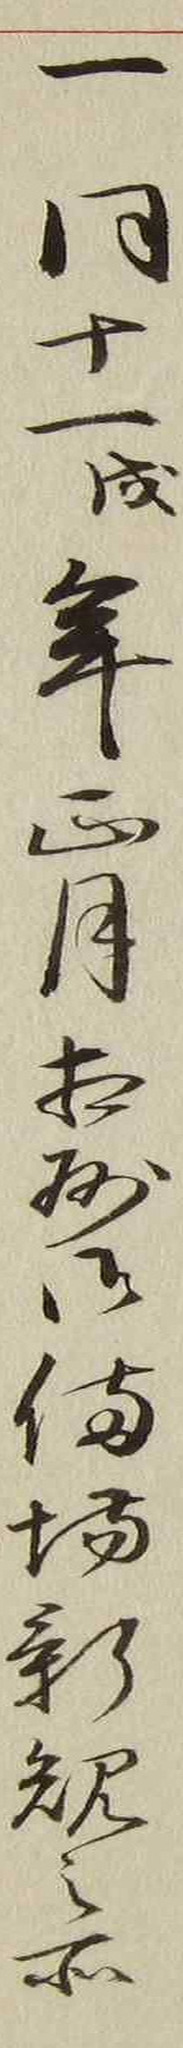一同十一戌年正月相州御備場新規之所
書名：諸士系譜　巻之114　か之部22
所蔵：会津若松市立会津図書館
